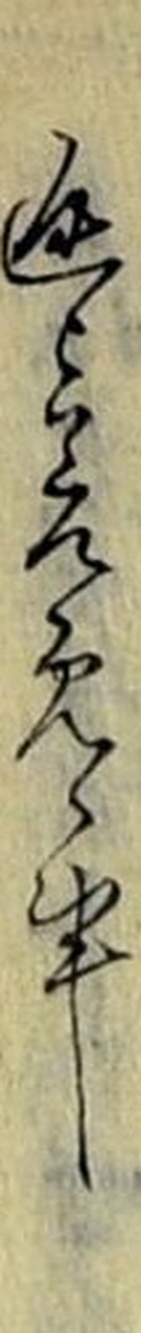通被差免候事
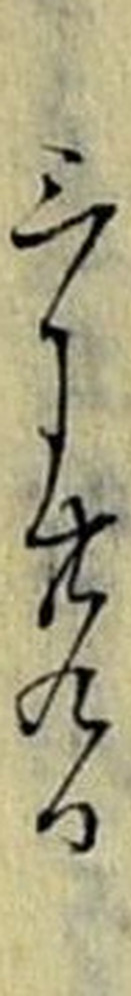三月廿九日
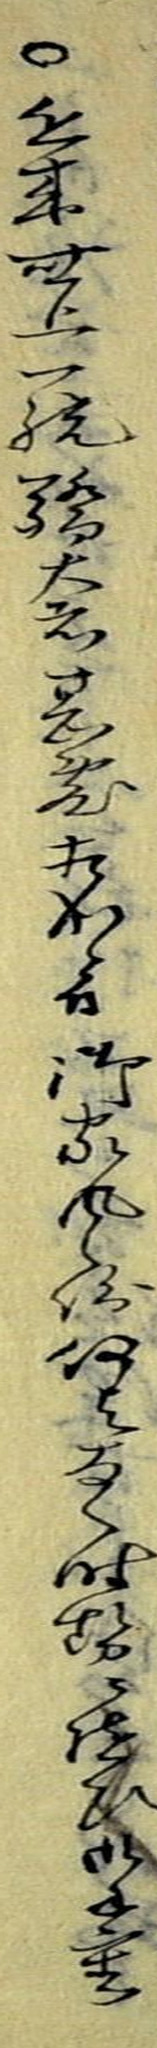○近来此上一統驕奢甚敷相成候に付御家風之儀何となく時勢に随ひ御手重

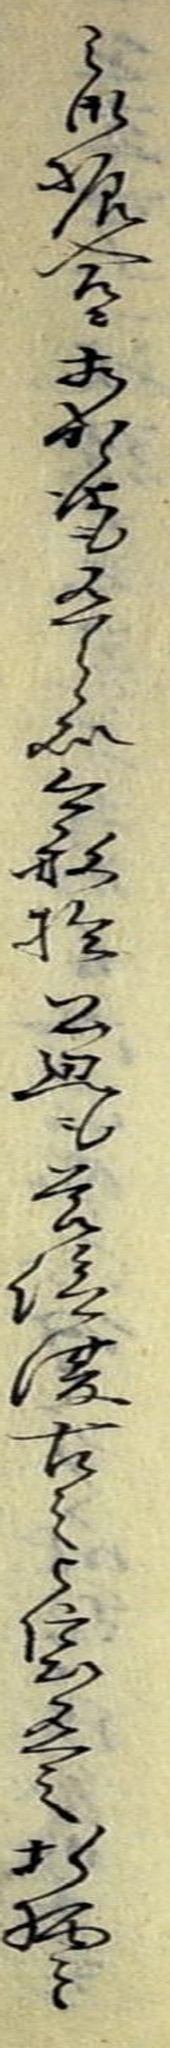之御振合に相成候儀も有之処今般於公辺も節倹復古之被仰出有之折柄に候
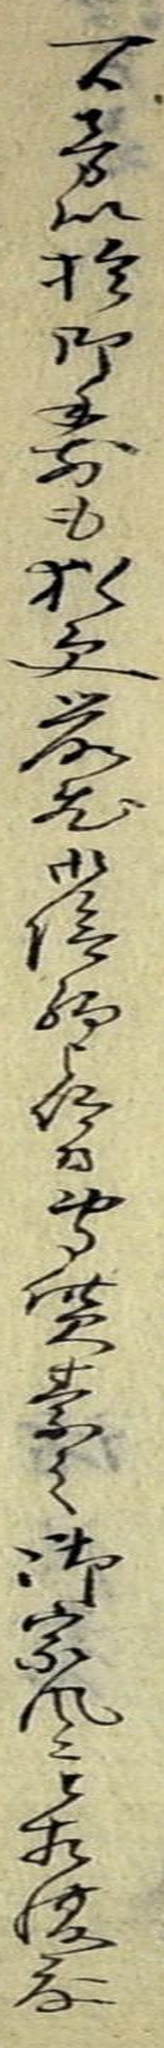へは旁以於御手前も猶更厳敷御倹約被仰付専質素之御家風に被相復度
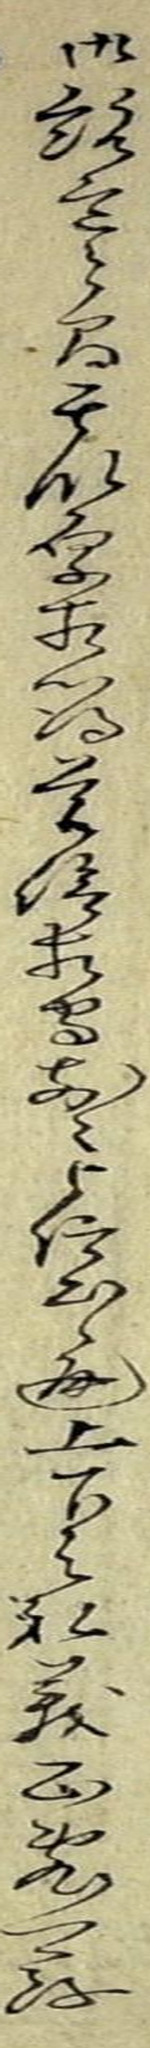御趣意に候間其段厚相心得節倹相守前々被仰出候通上下之礼義正敷可致
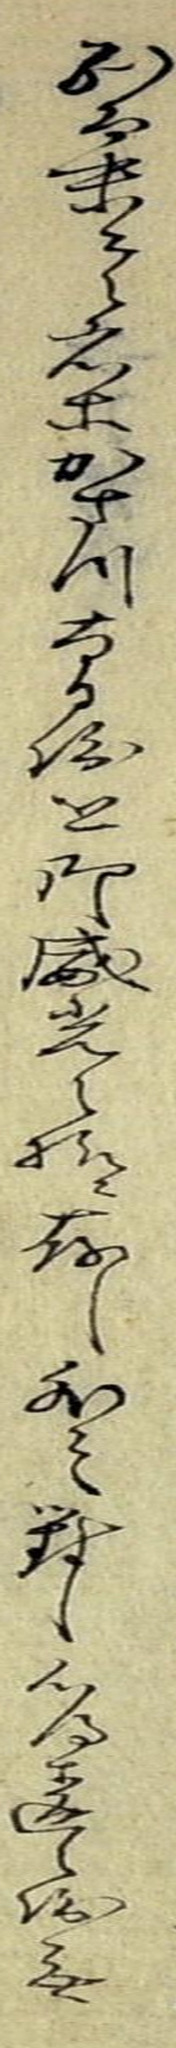別而末々之者等かさつなる儀を御威光之様に存し外々に対し心得違之儀無
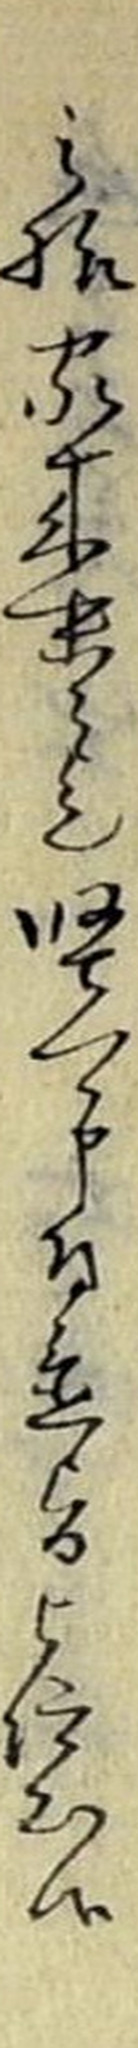之様家来末々迄堅可申付置旨被仰出候
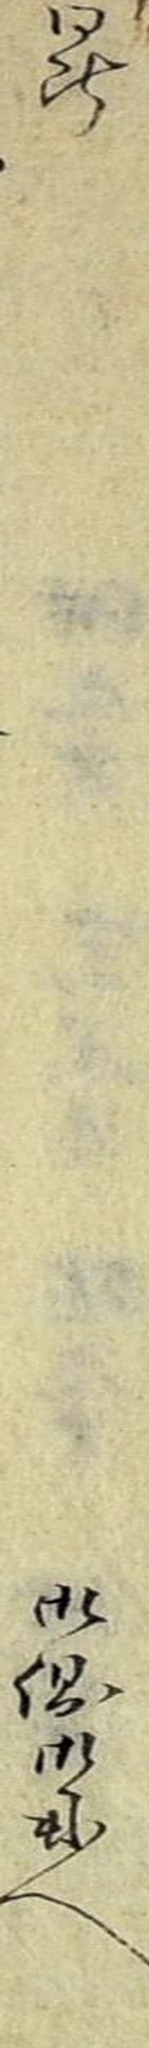同断御側御用人
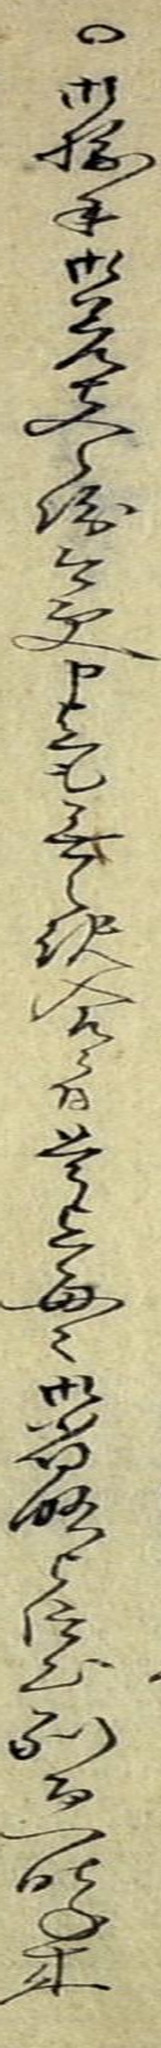○御勝手御差支之儀今更申迄も無之訳合に付是迄毎々御省略被仰出別而一昨年來
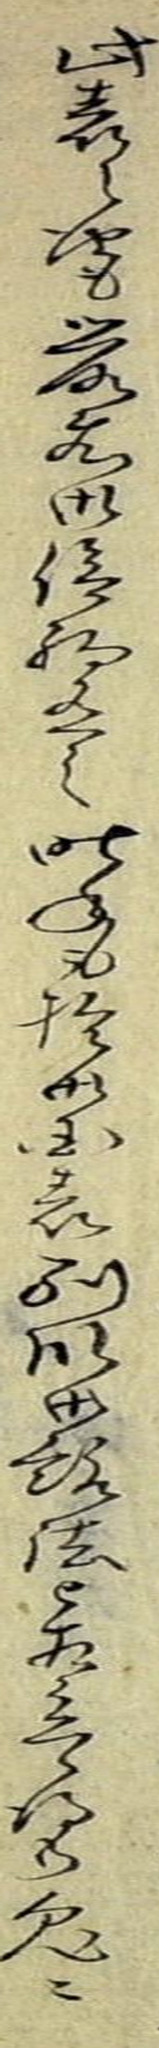此表之儀も厳敷御倹約有之昨年も於御国表別段御趣法被相立候得共兎に
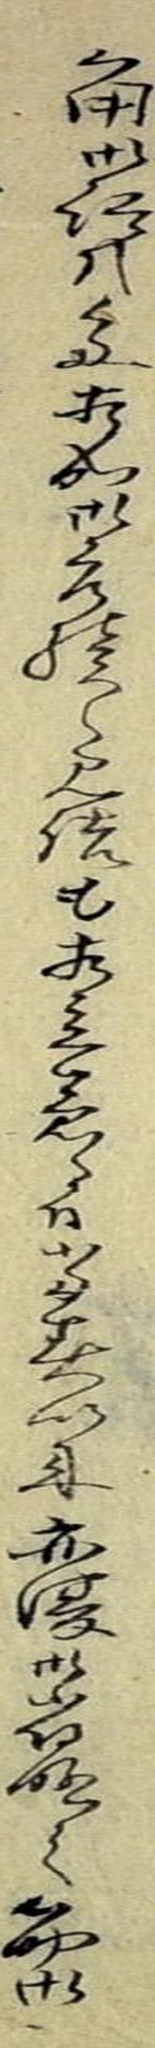角御跡引多相成御取続之見詰も相立兼候に付当春以来亦復御省略之筋御
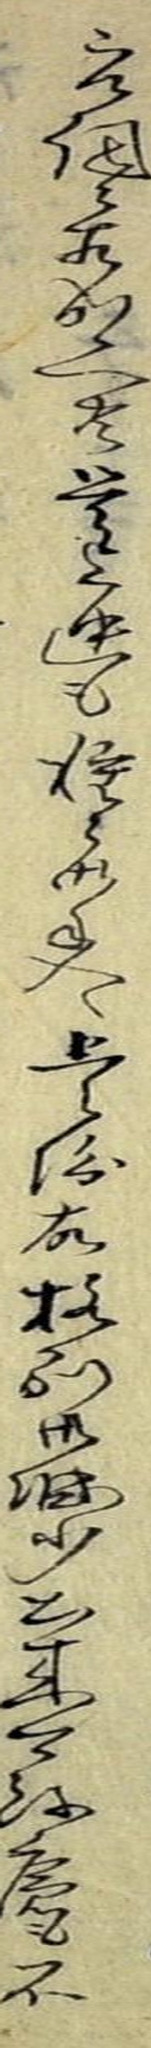取調に相成候へ共是迄迚も種々御手入候上之儀故各別御減少出来可致廉も不
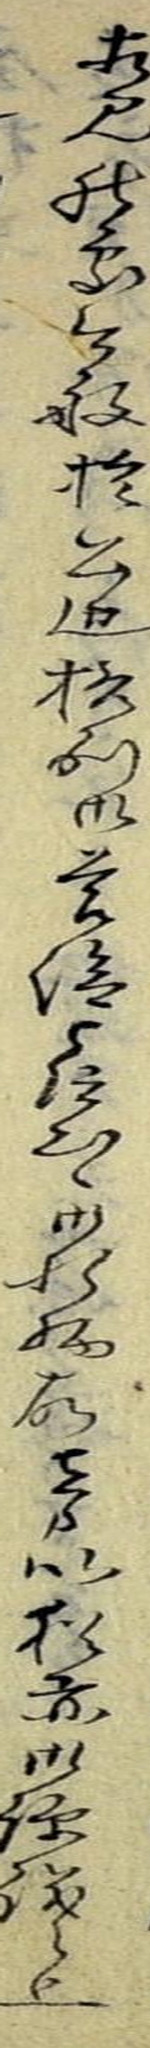相見然処今般於公辺各別御節倹被仰出候御折柄故旁以猶亦御評議之上
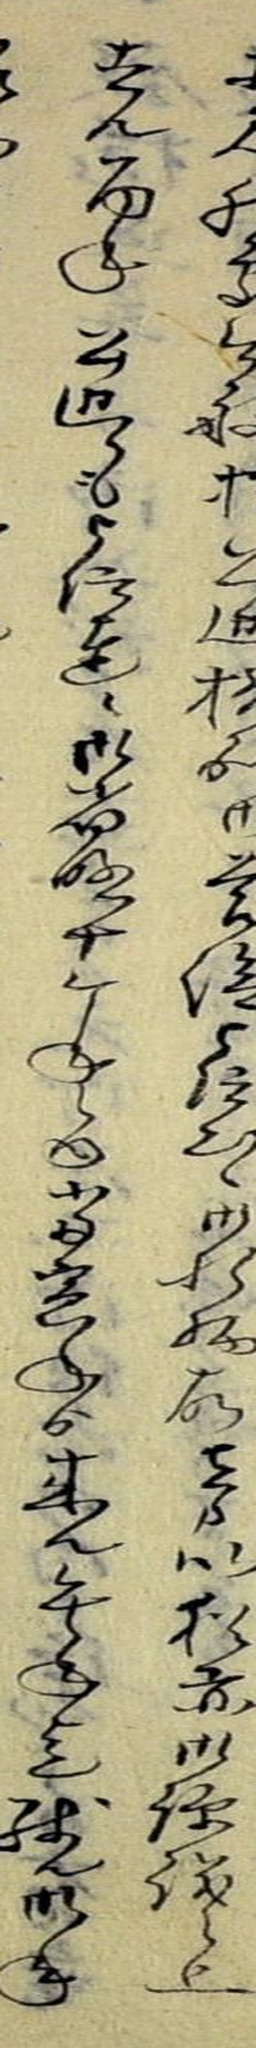去ル酉年公辺へも被仰達候御省略十ヶ年之内当寅年ゟ来ル午年迄残ル御年
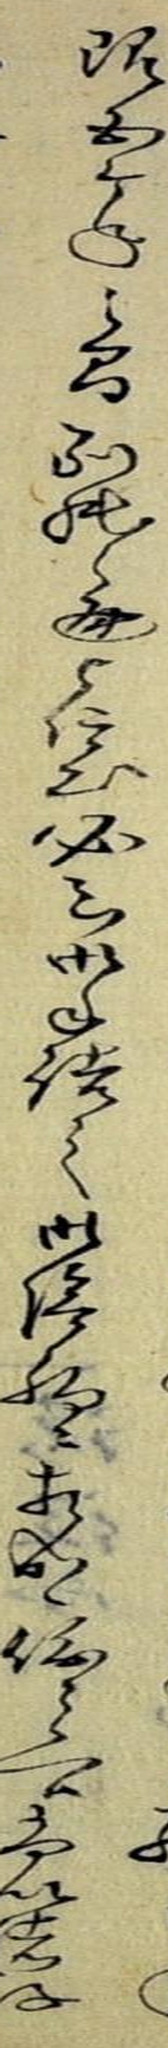限五ヶ年之間別紙之通被仰出必至御手詰之御倹約に相成候儀に候へは尚以諸役
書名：命令之部 六
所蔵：福井県文書館 Fukui Prefectural Archives
